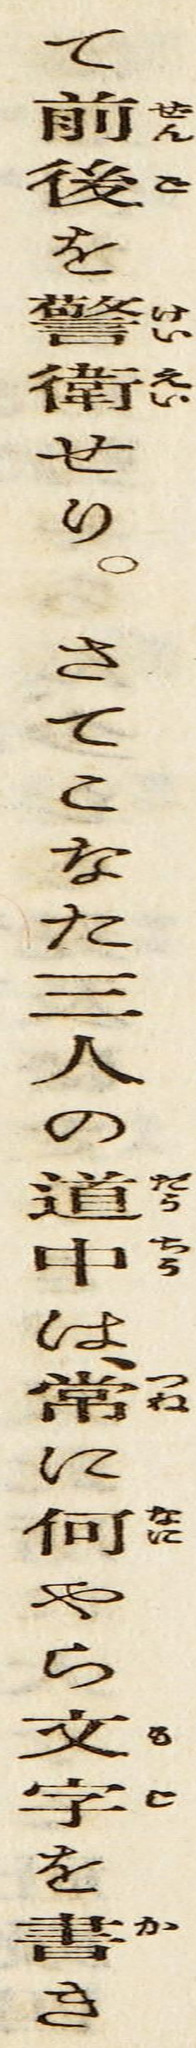て前後を警衛せり。さてこなた三人の道中は、常に何やら文字を書き
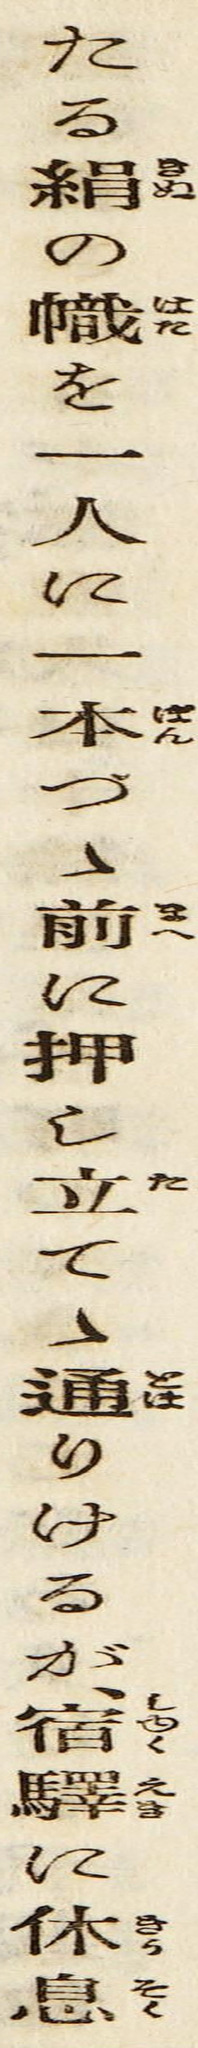たる絹の幟を一人に一本づゝ前に押し立てゝ通りけるが、宿駅に休息
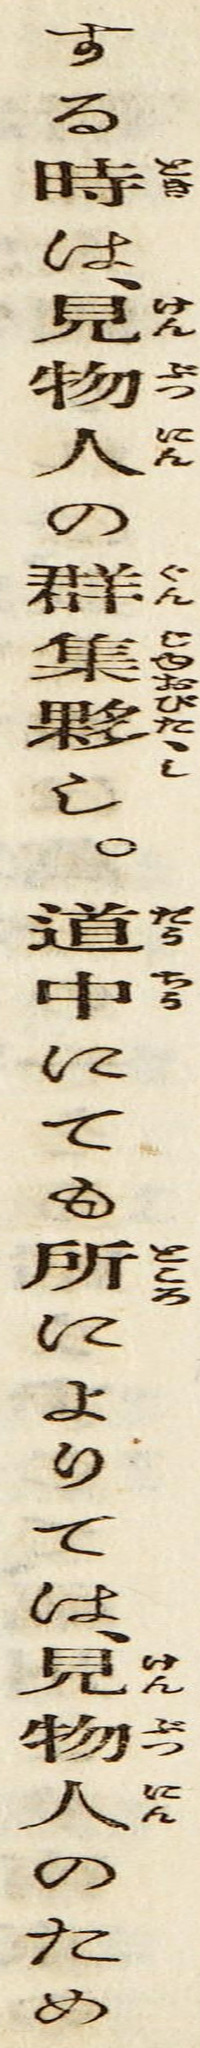する時は、見物人の群集夥し。道中にても所によりては、見物人のため
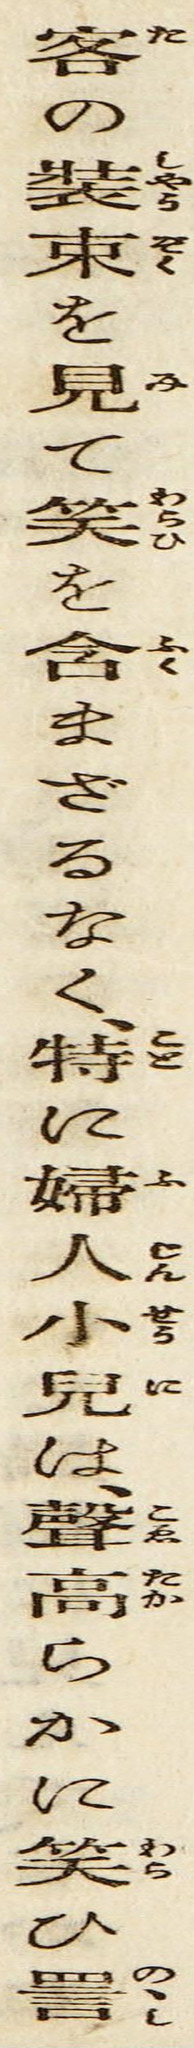客の装束を見て笑を含まざるなく、特に婦人小児は、声高らかに笑ひ詈

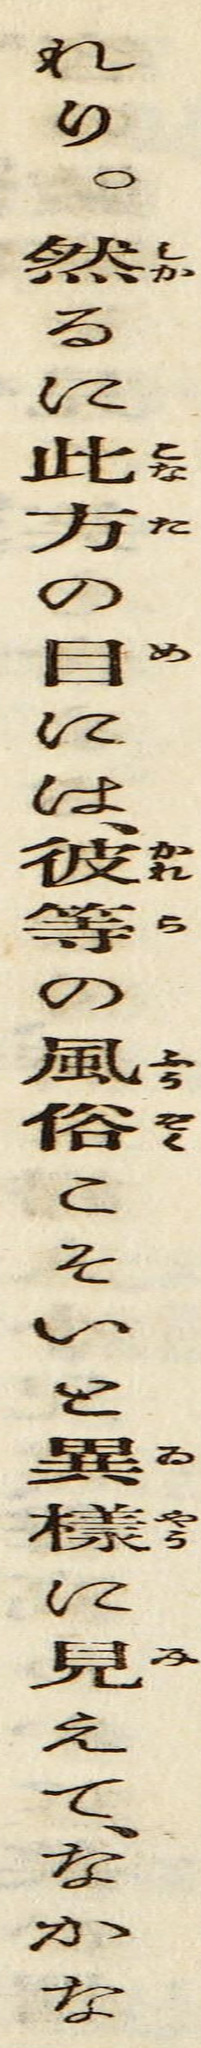れり。然るに此方の目には、彼等の風俗こそいと異様に見えて、なかな
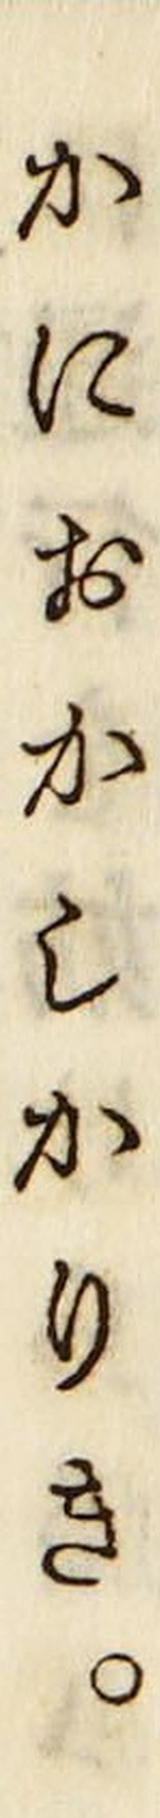かにおかしかりき。
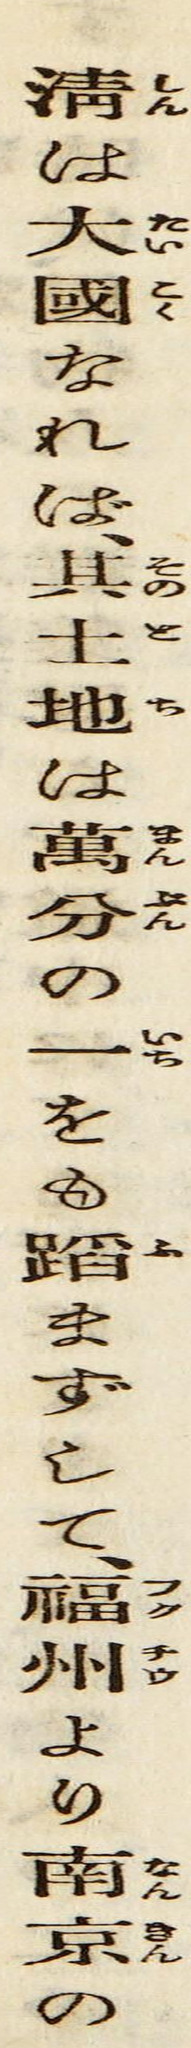清は大国なれば、其土地は万分の一をも蹈まずして、福州より南京の
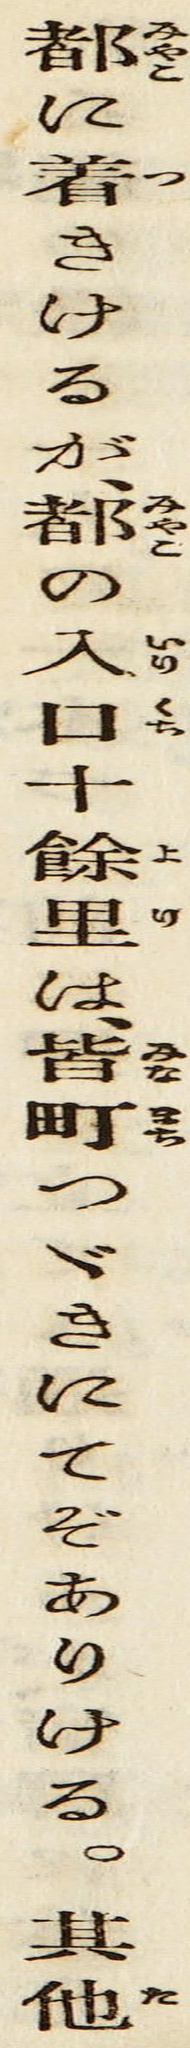都に着きけるが、都の入口十余里は、皆町つヾきにてぞありける。其他
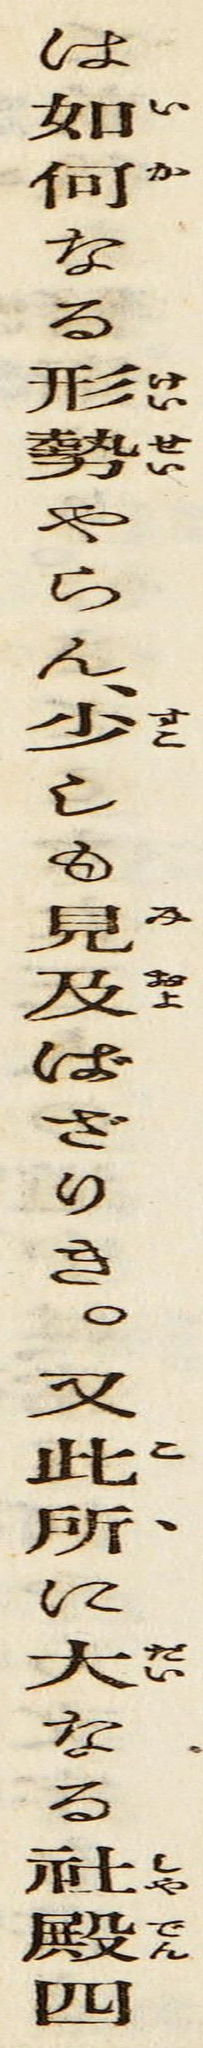は如何なる形勢やらん、少しも見及ばざりき。又此所に大なる社殿四
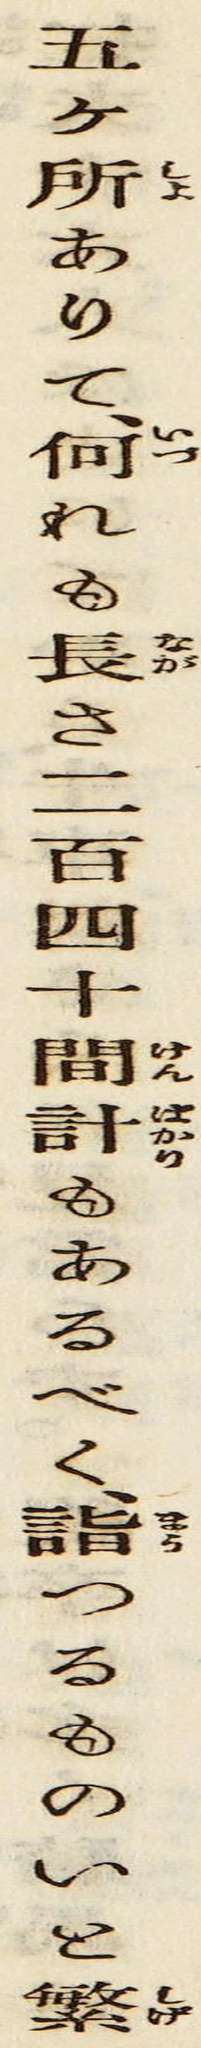五ケ所ありて、何れも長さ二百四十間計もあるべく、詣つるものいと繁
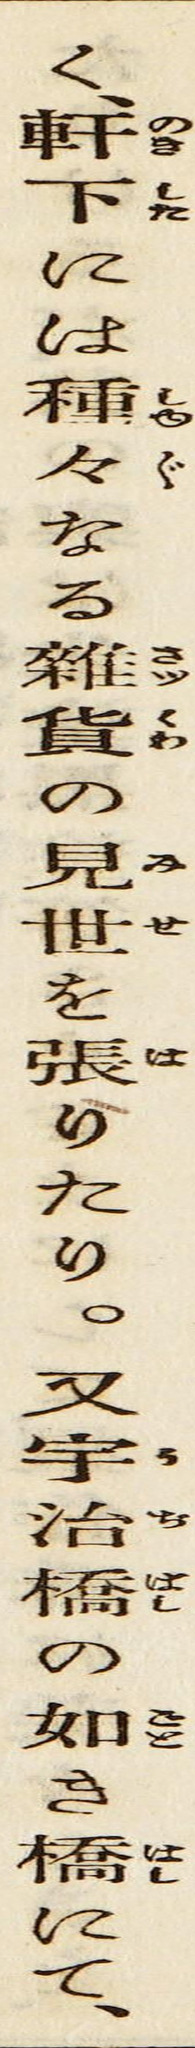く、軒下には種々なる雑貨の見世を張りたり。又宇治橋の如き橋にて、
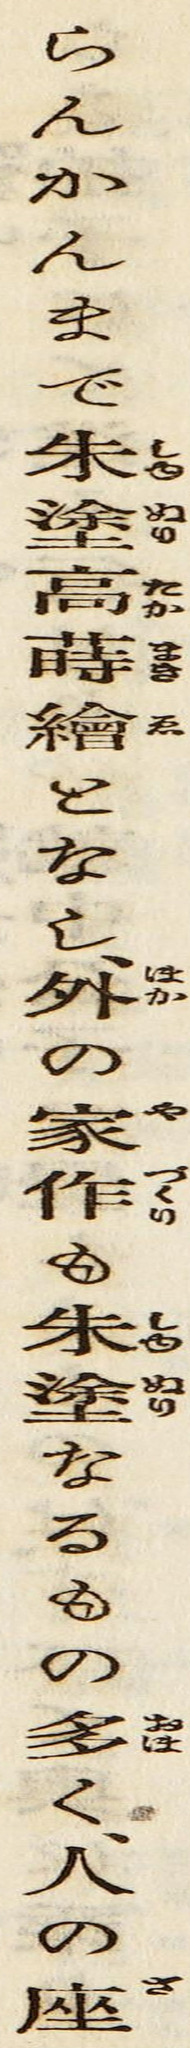らんかんまで朱塗高蒔絵となし、外の家作も朱塗なるもの多く、人の座
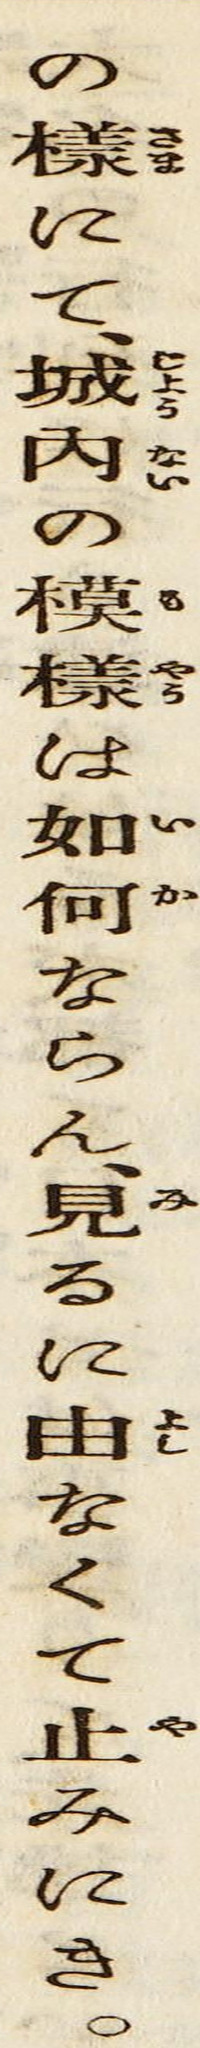の様にて、城内の模様は如何ならん、見るに由なくて止みにき。
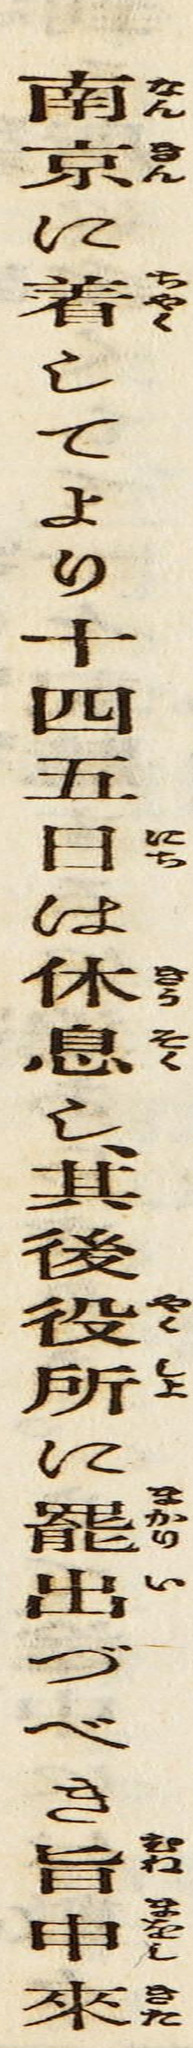南京に着してより十四五日は休息し、其後役所に罷出づべき旨申来
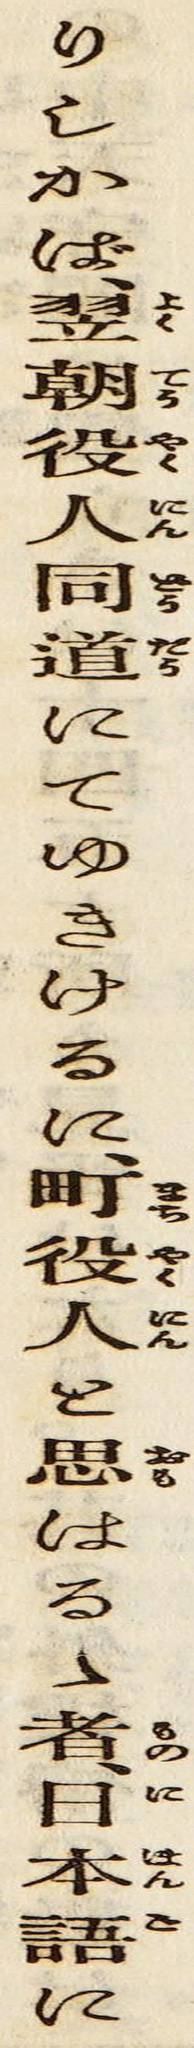りしかば、翌朝役人同道にてゆきけるに、町役人と思はるゝ者、日本語に
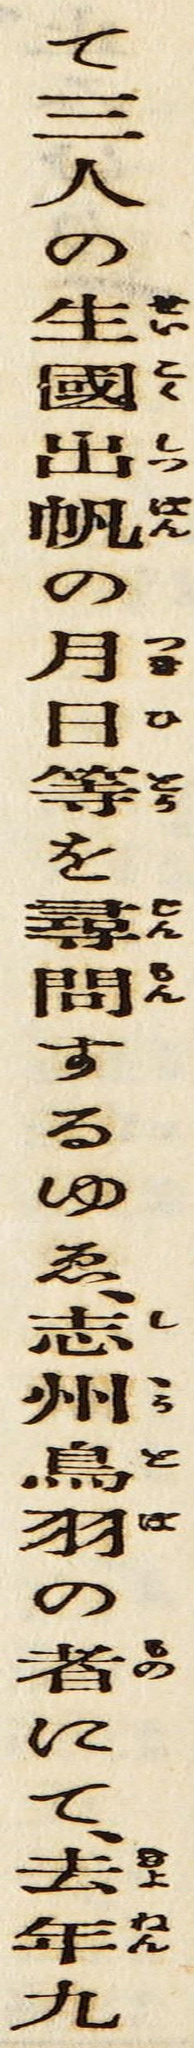て三人の生国出帆の月日等を尋問するゆゑ、志州鳥羽の者にて、去年九
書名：日本漂流譚
